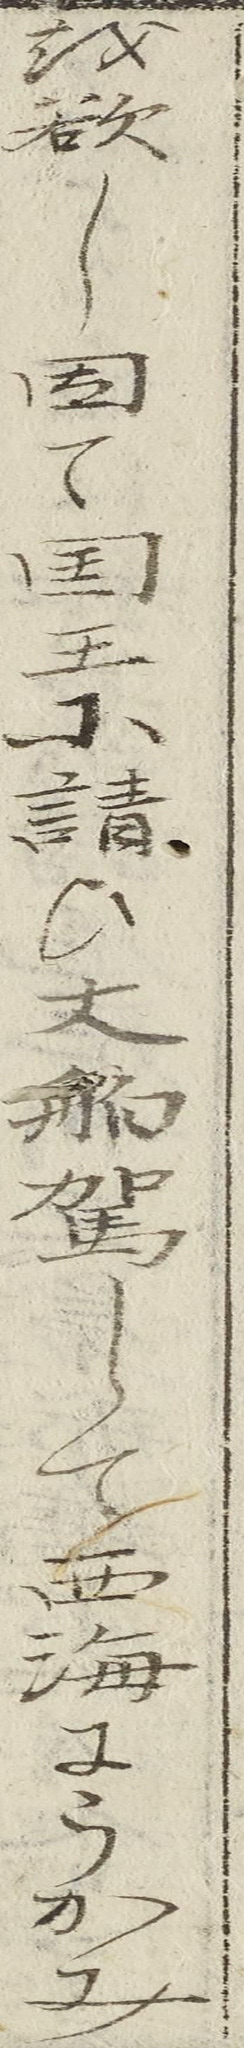を欲し因て国王に請ひ大舶駕して西海にうかみ
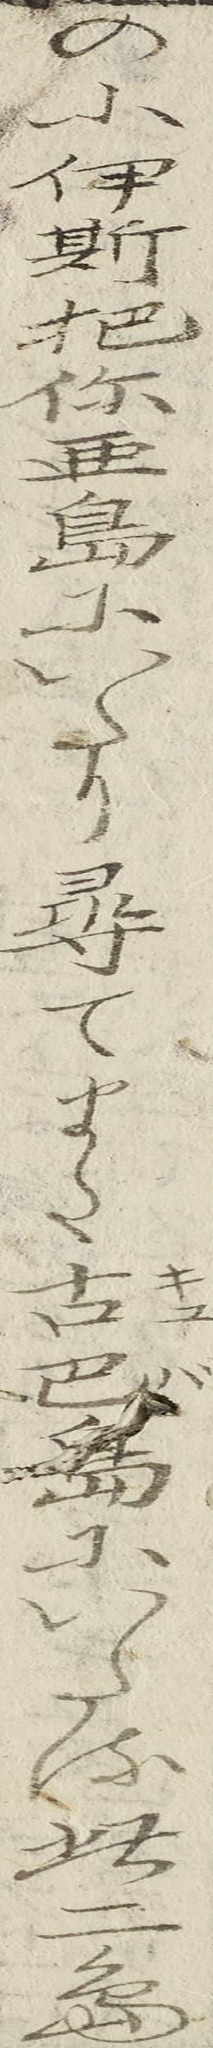の小伊斯把你亜島にいたり訪てまた古巴島にいたる此二島
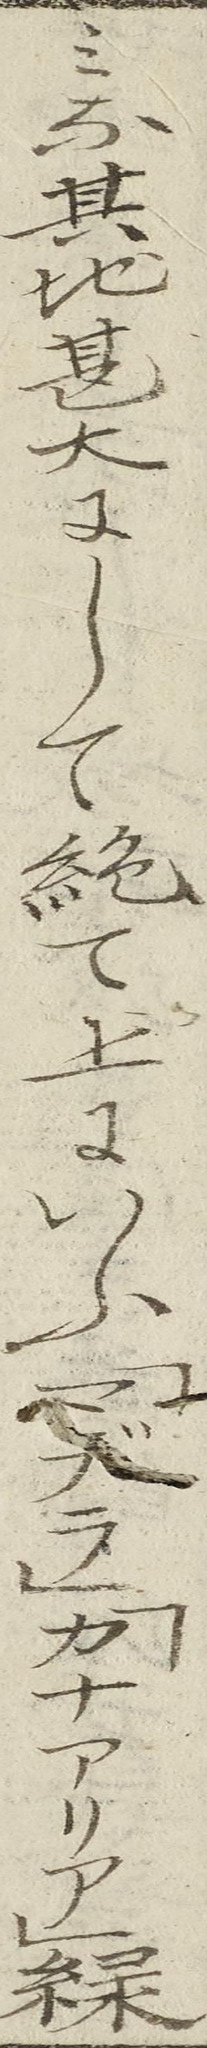ミな其地甚大にして絶て上にいふ「マデラ」「カナリア」繰
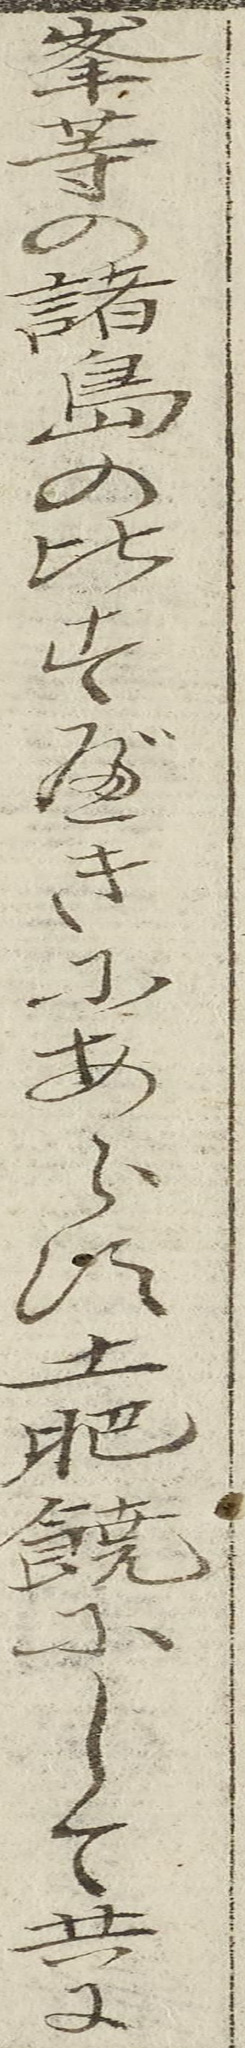峯等の諸島の比すべきにあらす土肥饒にして共に
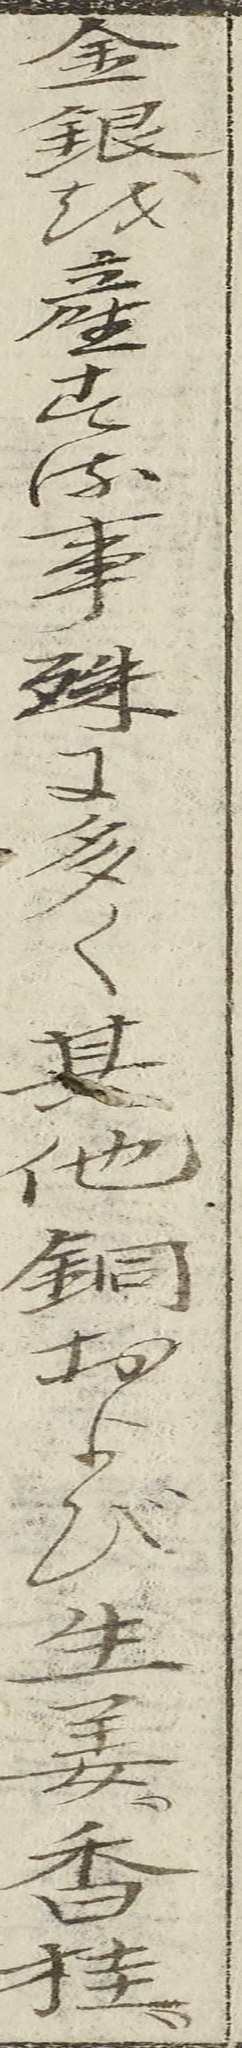金銀を産する事特に多く其他銅および生姜。香挂。
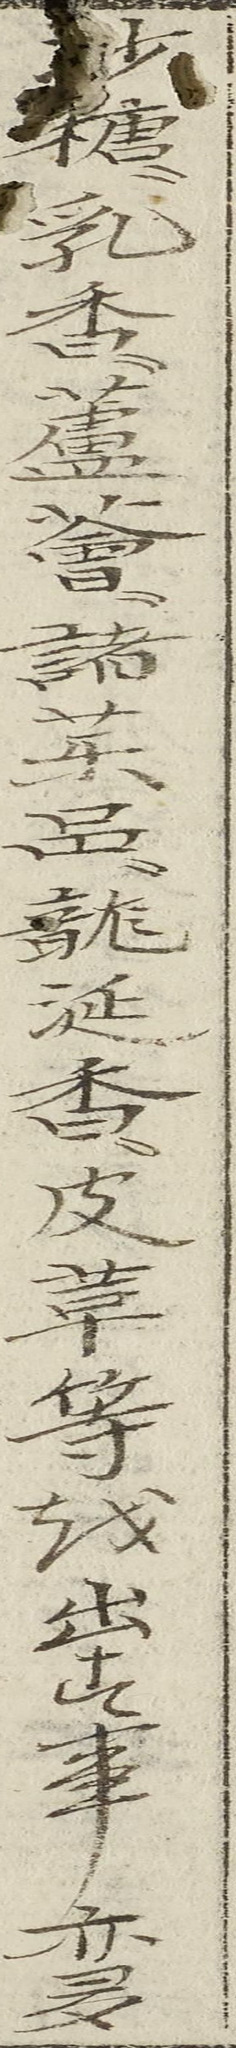沙糖。乳香。蘆薈。諸菜品。龍涎香。皮革等を出す事亦多
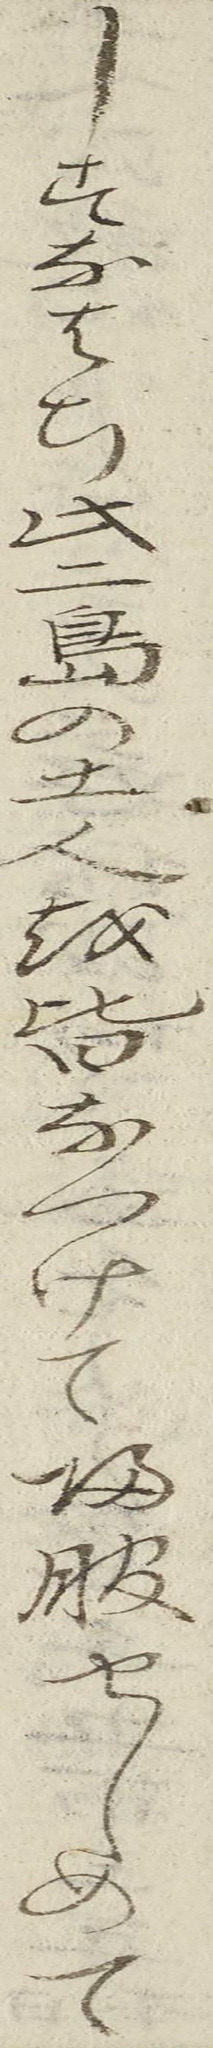しすなはち此二島の土人を皆なつけて帰服せしめて
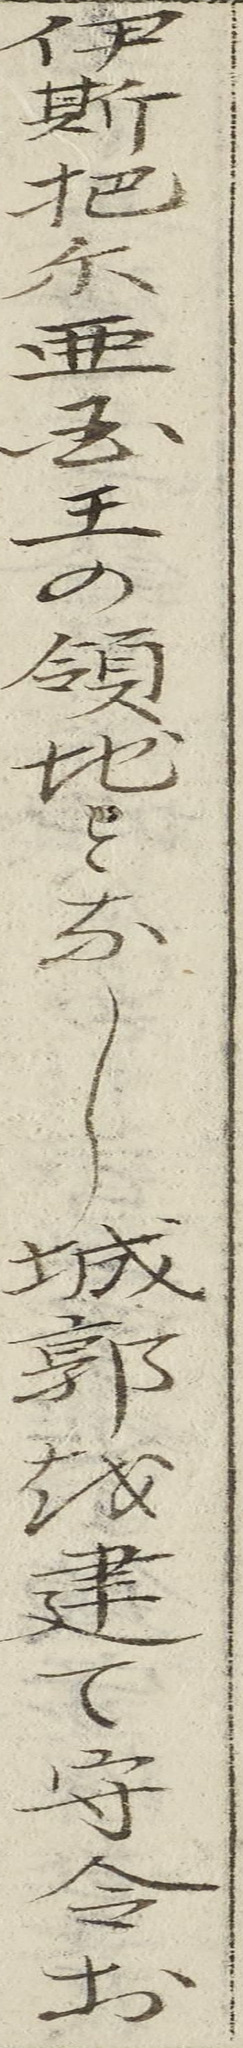伊斯把尓亜国王の領地となし城郭を建て守令お
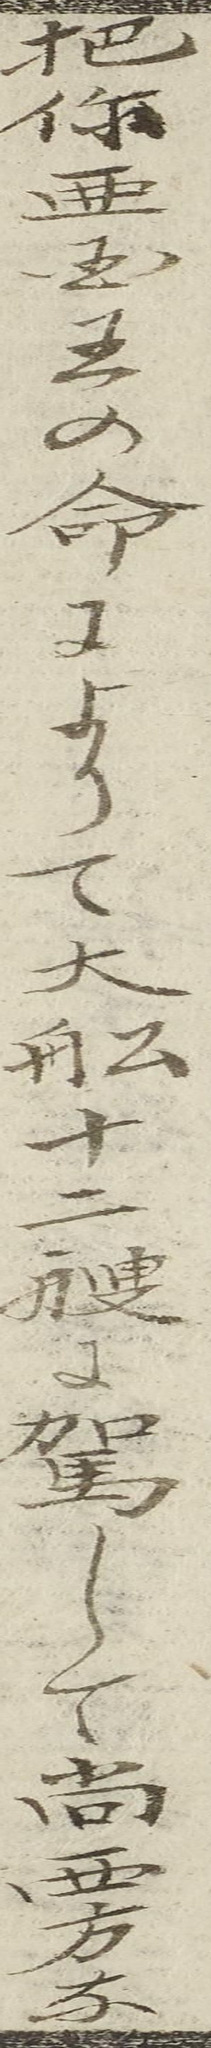把你亜国王の命によりて大船十二艘に駕して尚西方な
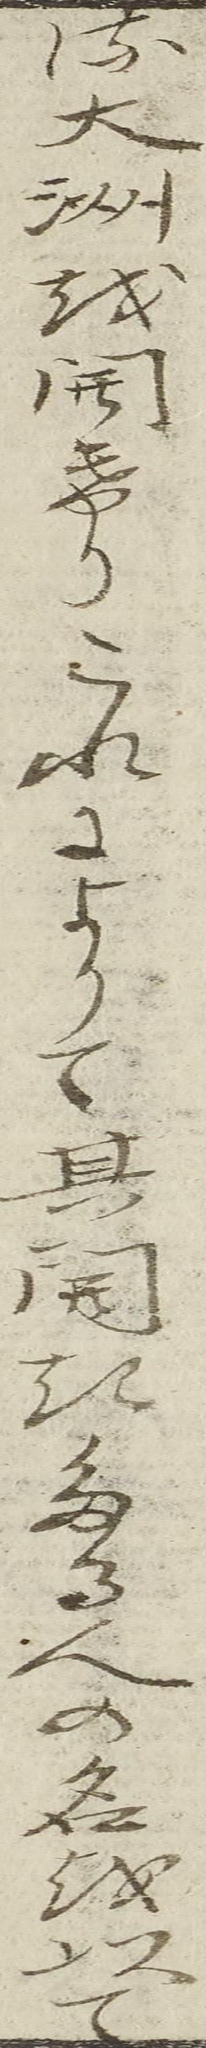る大州を開けりこれによりて其開きたる人の名を以て
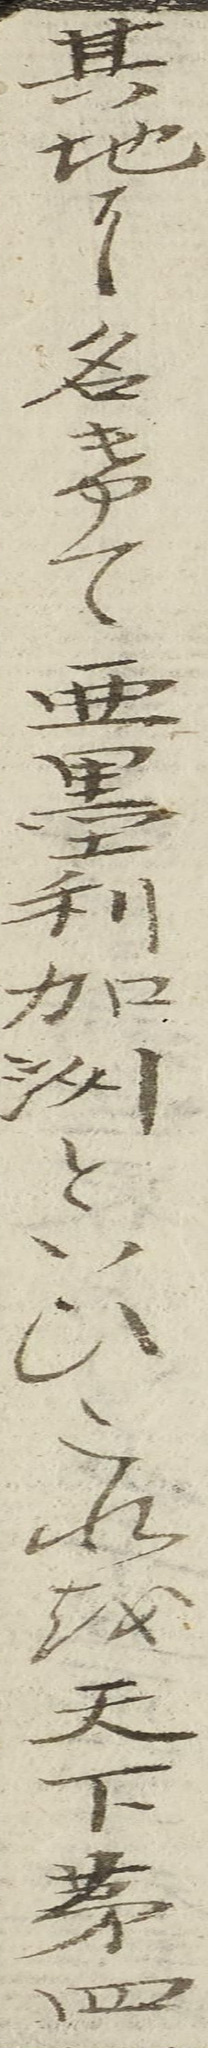其地に名けて亜墨利加州といひこれを天下第四

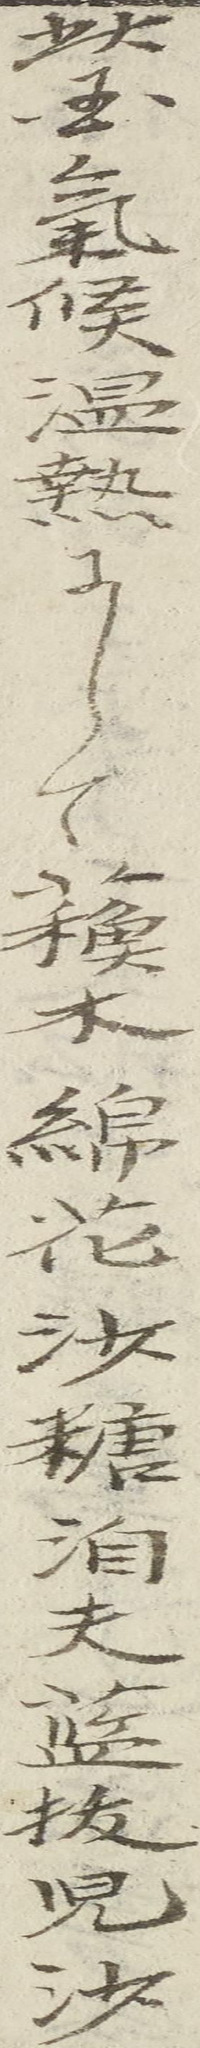此国気候温熱にして蘓木綿花沙糖洎夫藍抜児沙
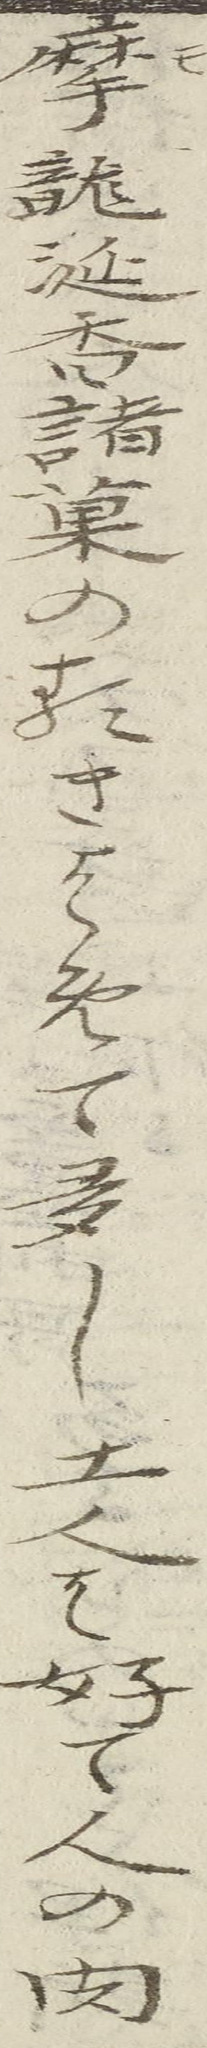摩龍涎香諸菓の類きはめて多し土人は好て人の肉
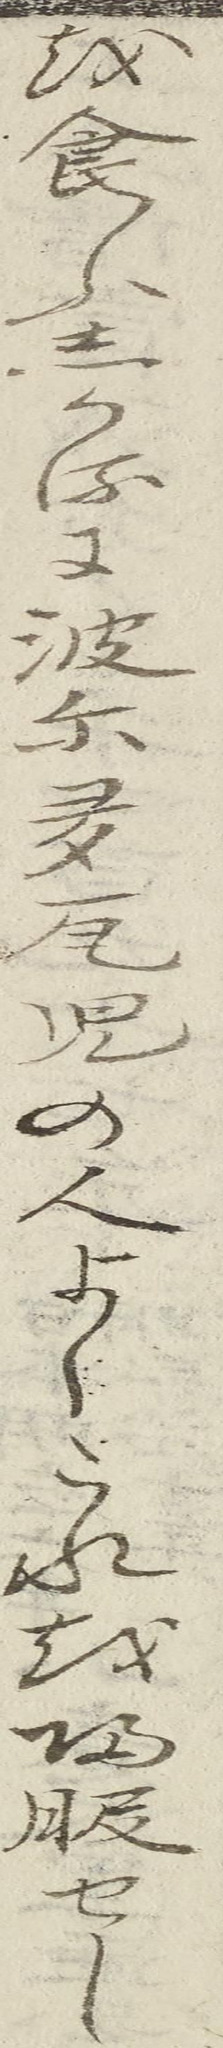を食ふしかるに波尓多亙児の人よくこれを帰服せし
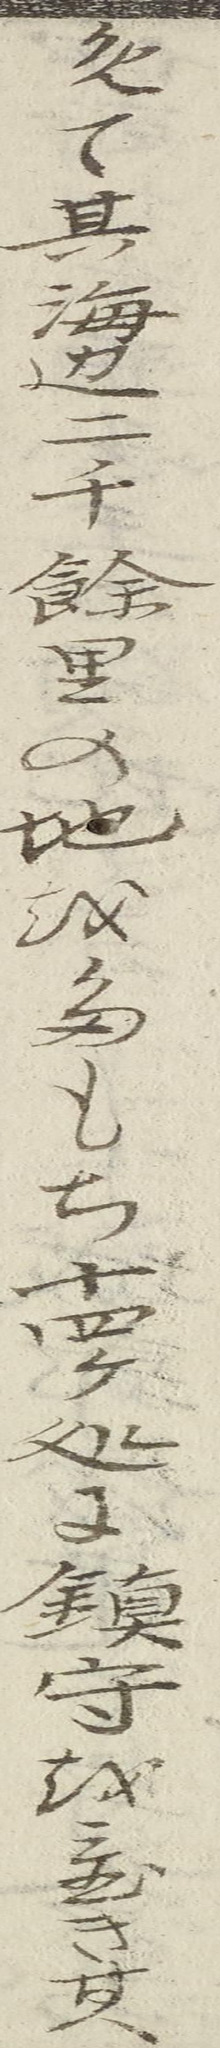めて其海辺二千余里の地をたもち十四ヶ処に鎮守を置き其
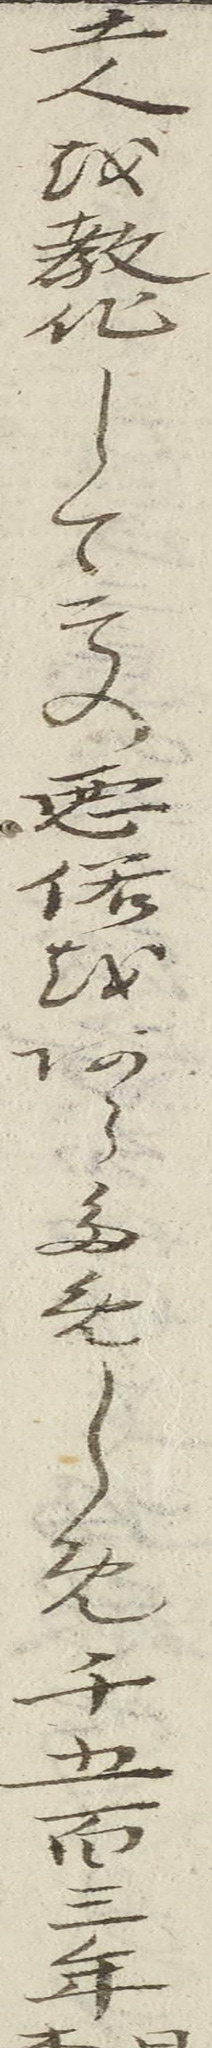土人を教化してその悪修をあらためしめ千五百三年日本
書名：西洋雜記　乾
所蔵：東京大学地震研究所図書室 Earthquake Research Institute Library, The University of Tokyo, JAPAN
